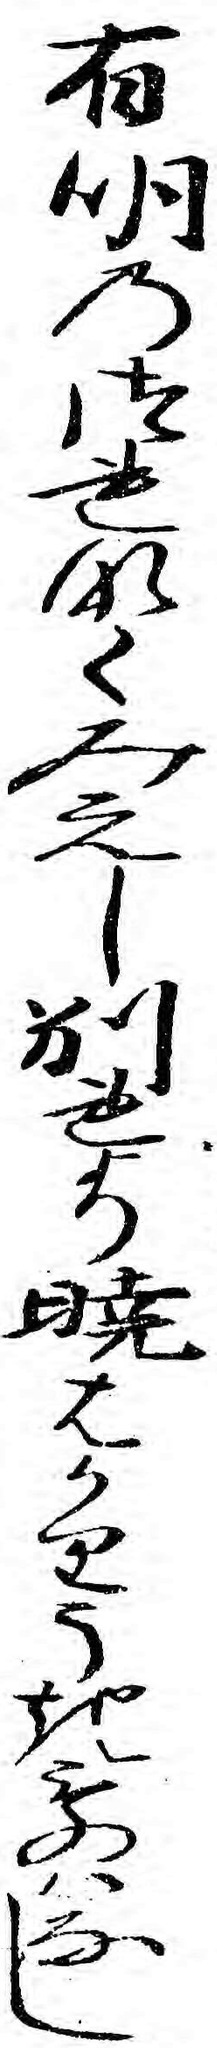有明のつれなくみえし別れより暁ばかりうきものはなし
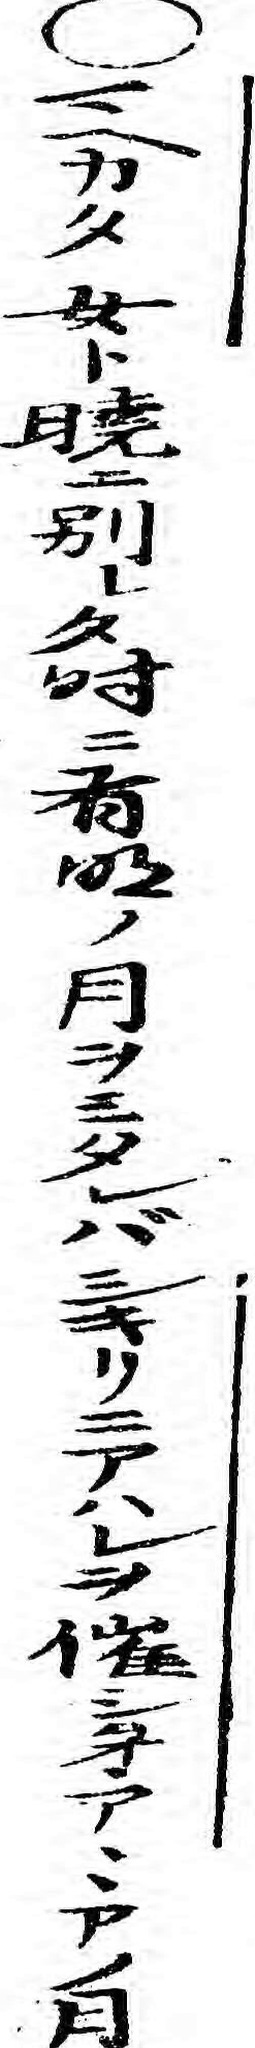○マヘカタ女ト暁ニ別レタ時ニ有明ノ月ヲミタレバシキリニアハレヲ催シテアヽヽアノ月
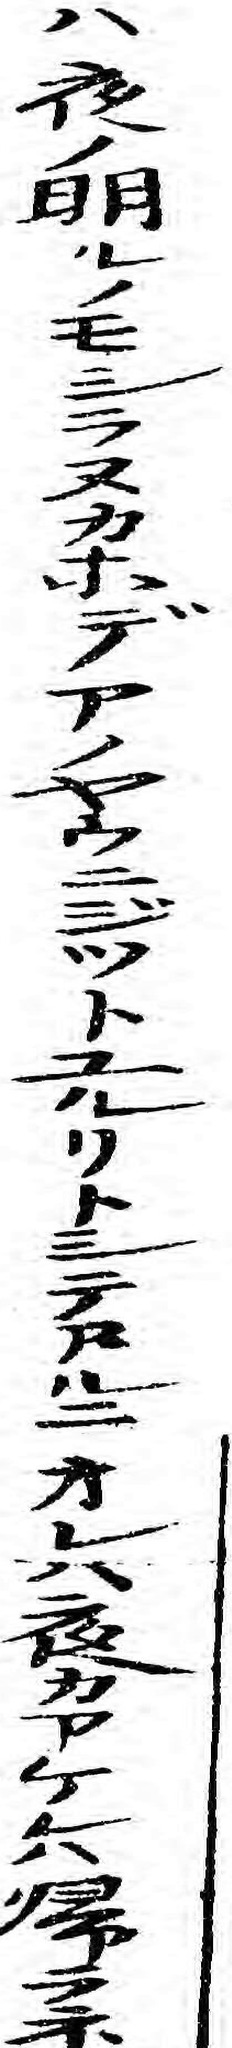ハ夜ノ明ルノモシラヌカホデアノヤウニジツトユルリトシテアルニオレハ夜カアケレハ帰ラネ
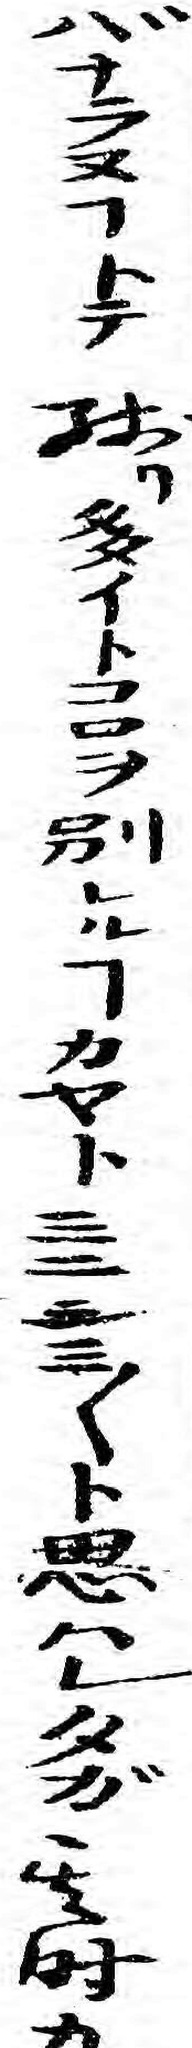バナラヌコトトテ残リ多イトコロヲ別レルコトカヤトミニシミ〳〵ト思ハレタガ其時カ
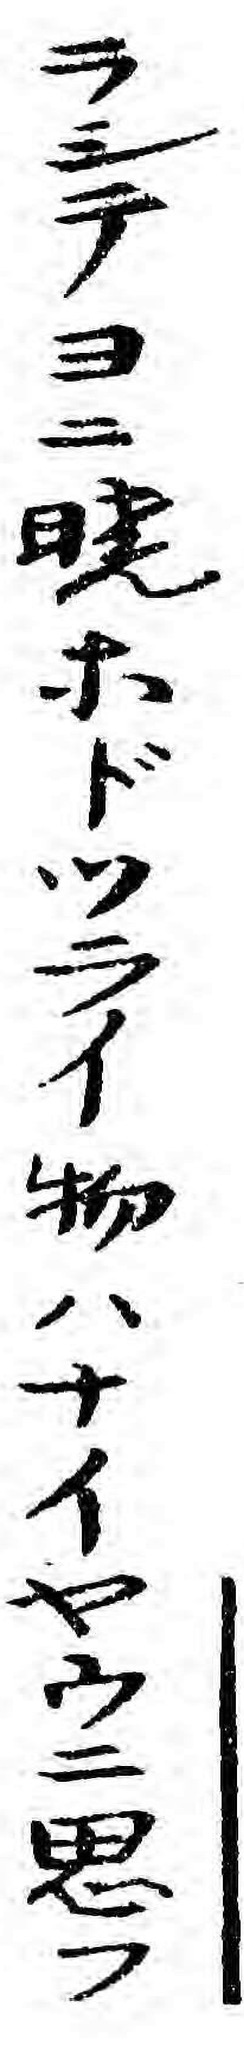ラシテヨニ暁ホドツイライ物ハナイヤウニ思フ
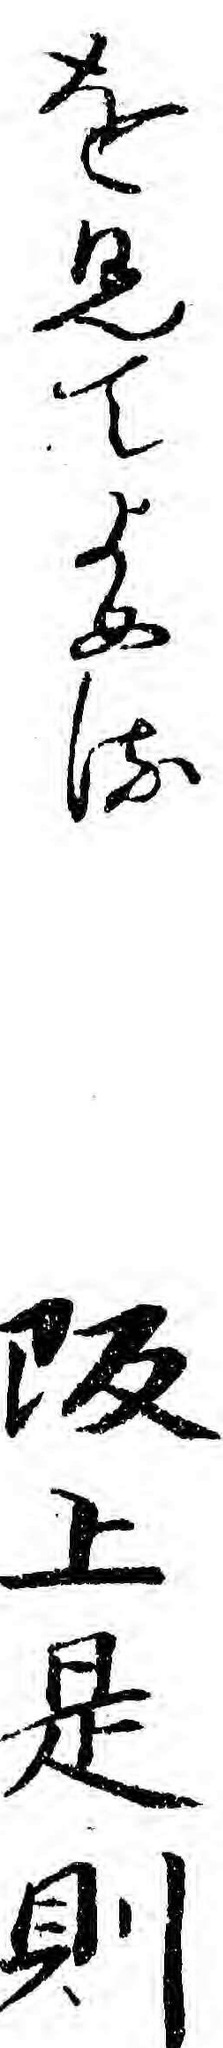を見てよめる坂上是則
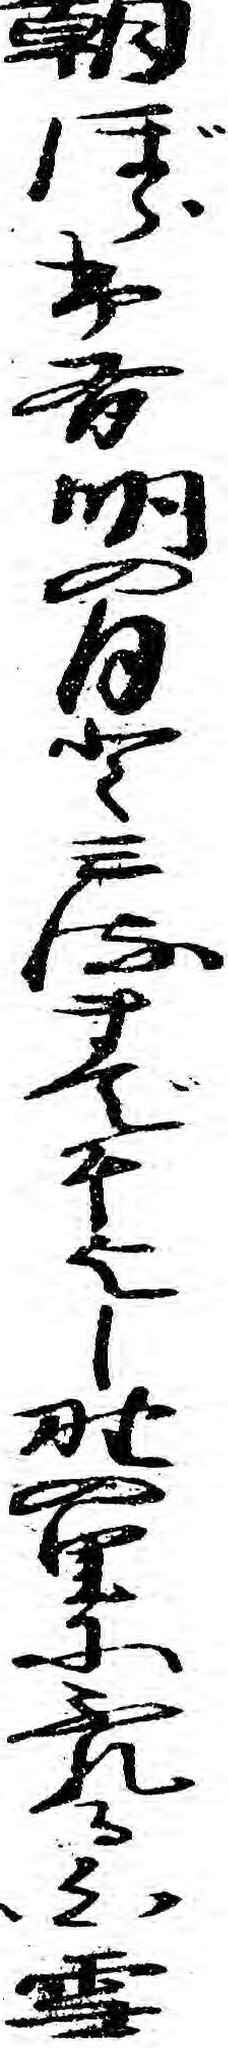朝ぼらけ有明の月とみるまでによしのの里にふれる白雪
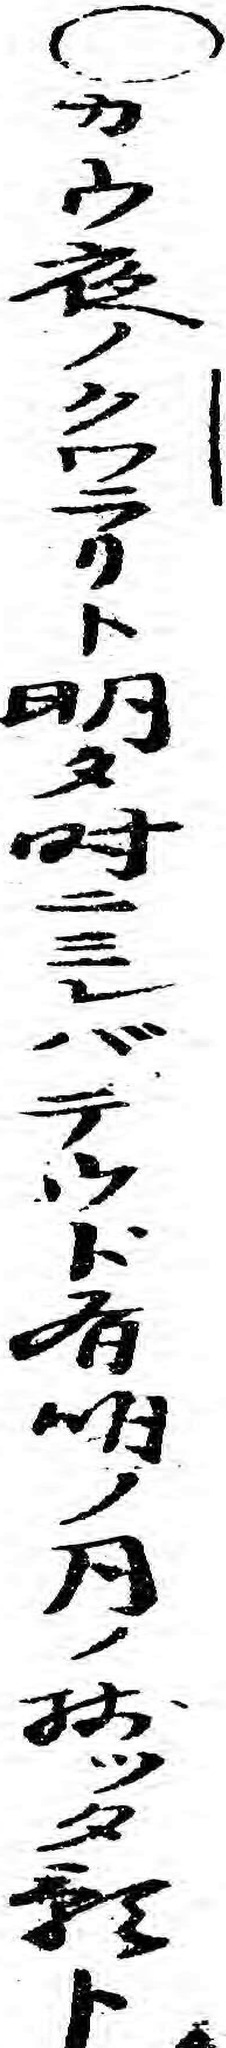○カウ夜ノクワラリト明タ時ニミレバテウド有明ノ月ノ残ツタ朝ト

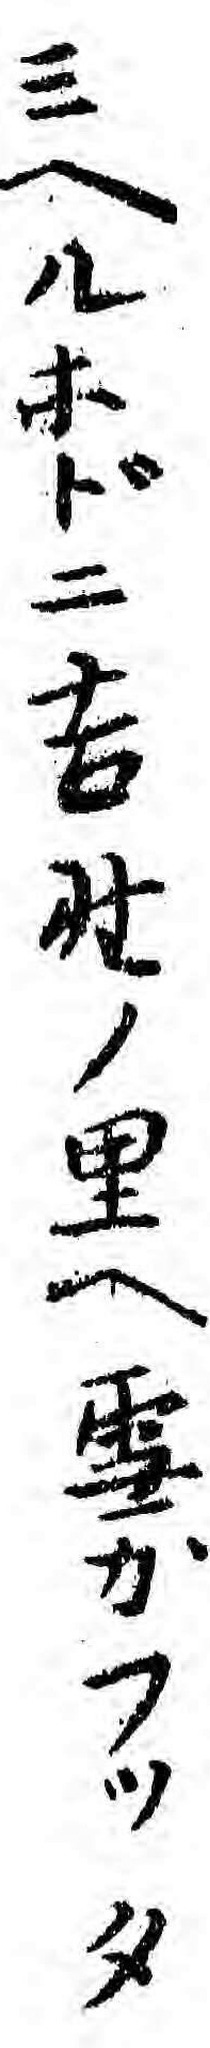ミヘルホドニ吉野ノ里ヘ雪ガフツタ
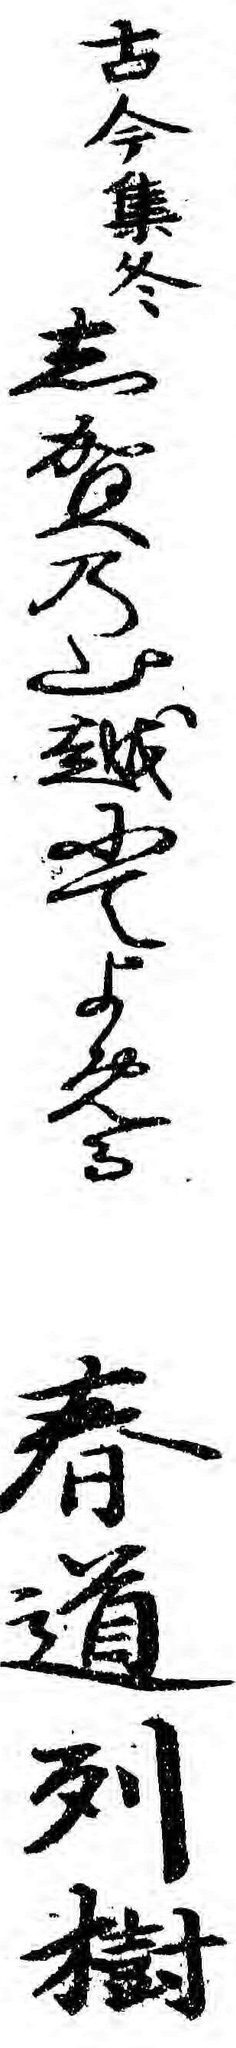古今集冬志賀の山越にてよめる春道列樹
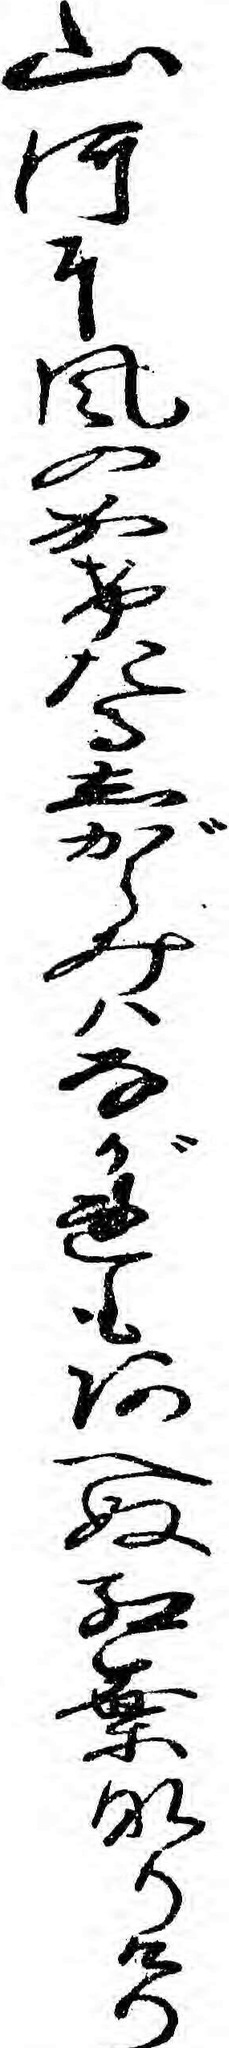山河に風のかけたるしがらみはながれもあへぬ紅葉なりけり
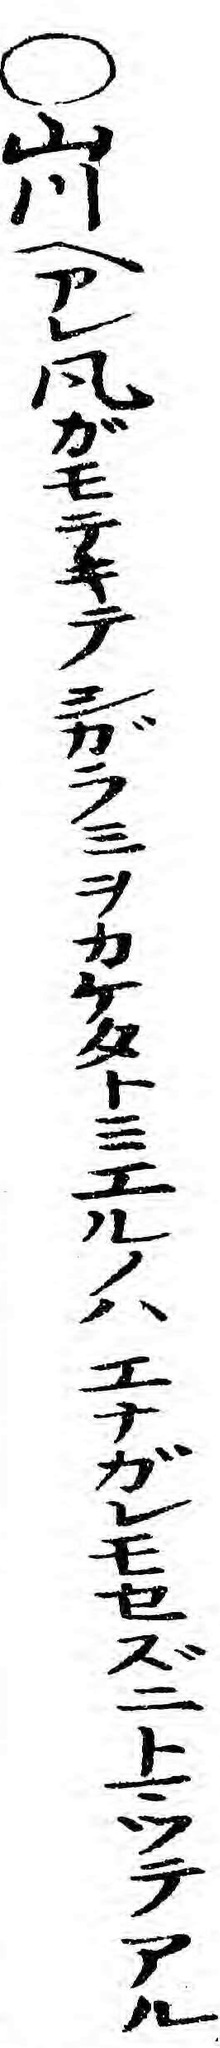○山川ヘアレ風ガモテキテシガラミヲカケタトミエルノハエナガレモセズニトマツテアル
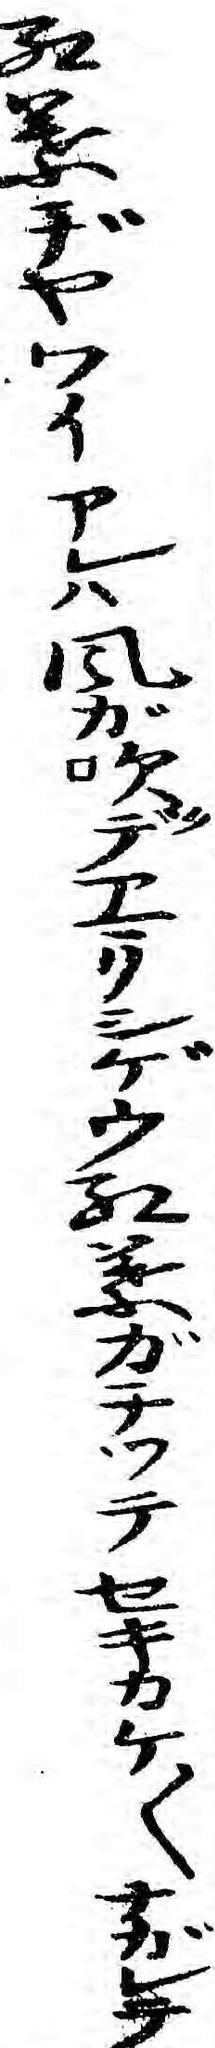紅葉ヂヤワイアレハ風ガ吹テアマリシゲウ紅葉ガチツテセキカケ〳〵ナガレテ
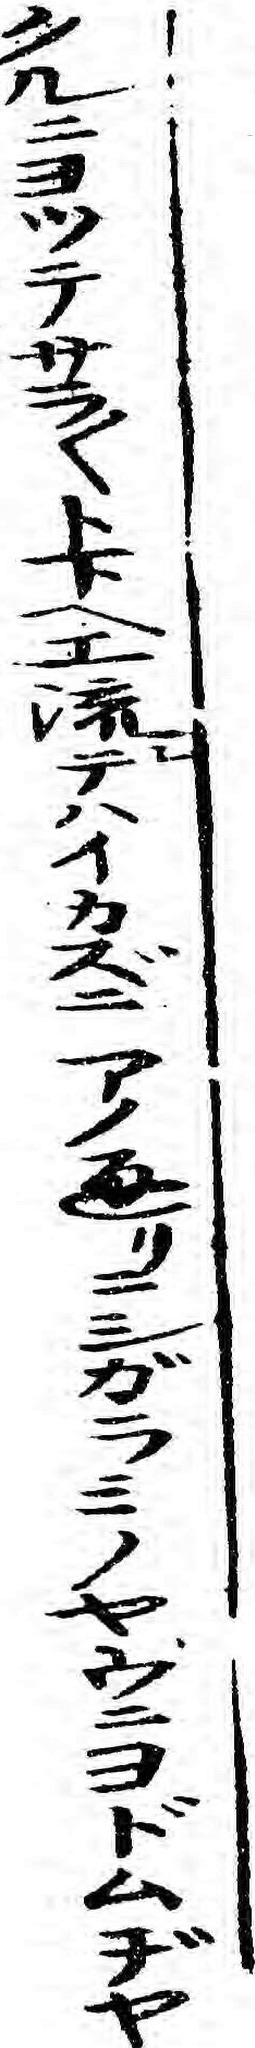クルニヨツテサラ〳〵ト下ヘエ流レテハイカズニアノ通リニシガラミノヤウニヨドムヂヤ
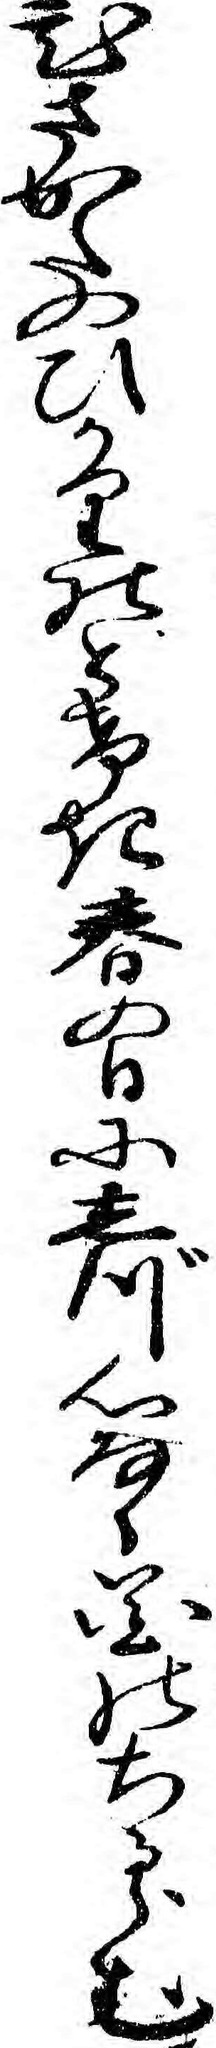ひさかたのひかりのどけき春の日にしづ心なく花のちるらむ
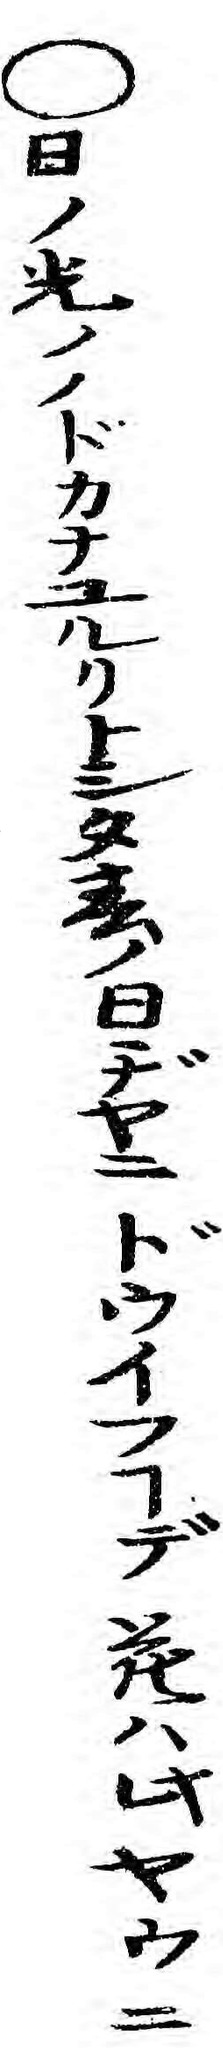○日ノ光ノノドカナユルリトシタ春ノ日ヂヤニドウイフコトデ花は此ヤウニ
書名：百人一首／小倉の山ふみ
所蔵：国文学研究資料館
